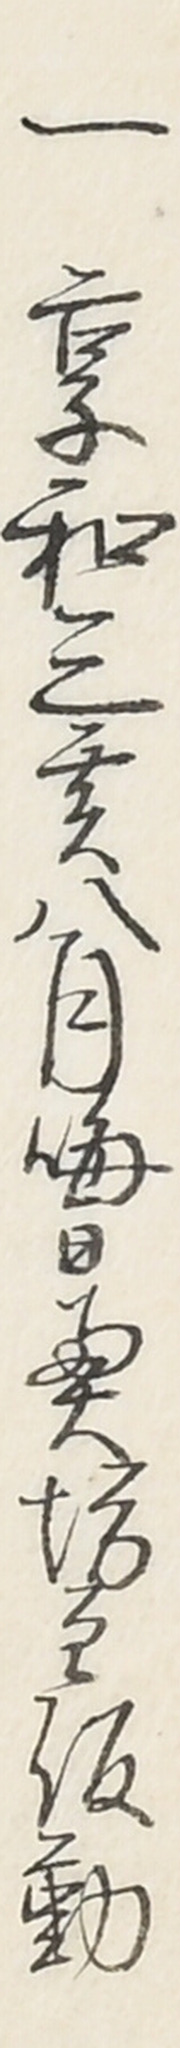一享和三亥八月晦日奥坊主仮勤
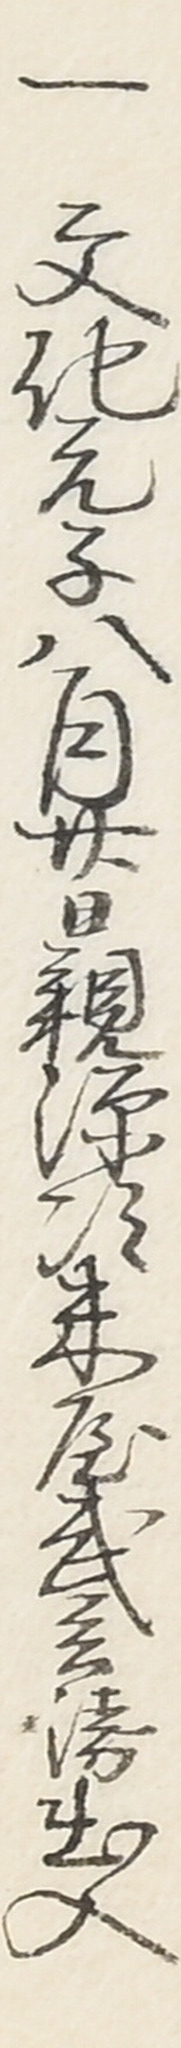一文化元子八月廿日親源次米屋武兵衛出入
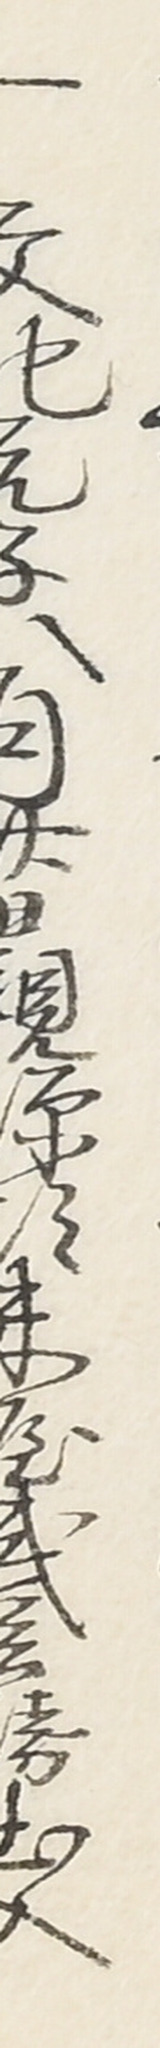一文化元子八月廿日親源次米屋武兵衛出入
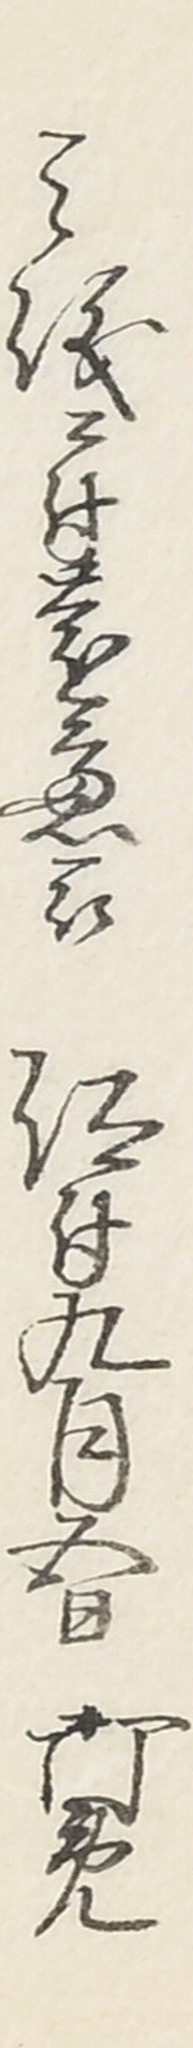之儀ニ付遠慮被仰付九月五日御免
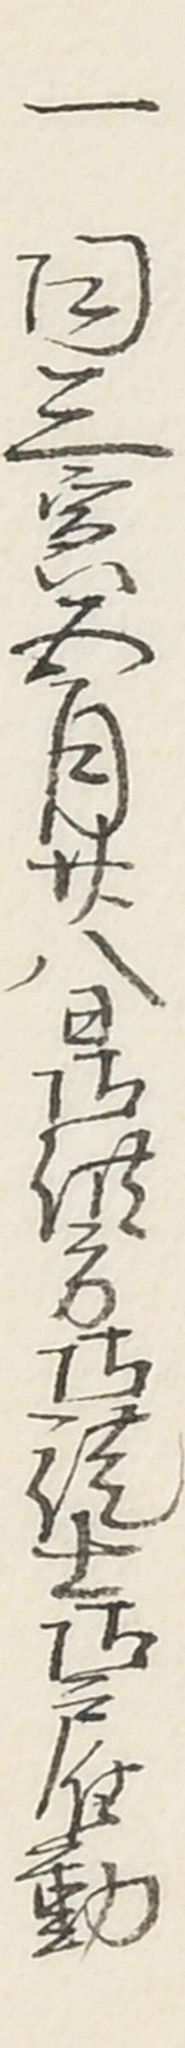一同三寅五月廿八日御供方御徒士御雇勤
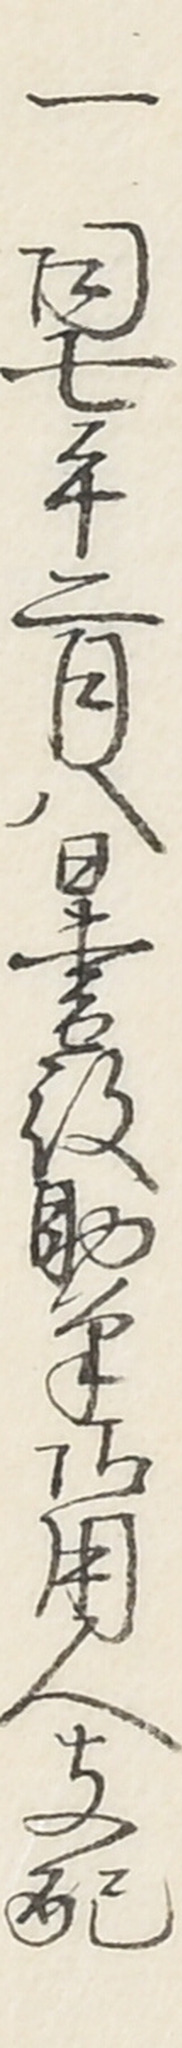一同七午二月八日書役助筆御用人支配
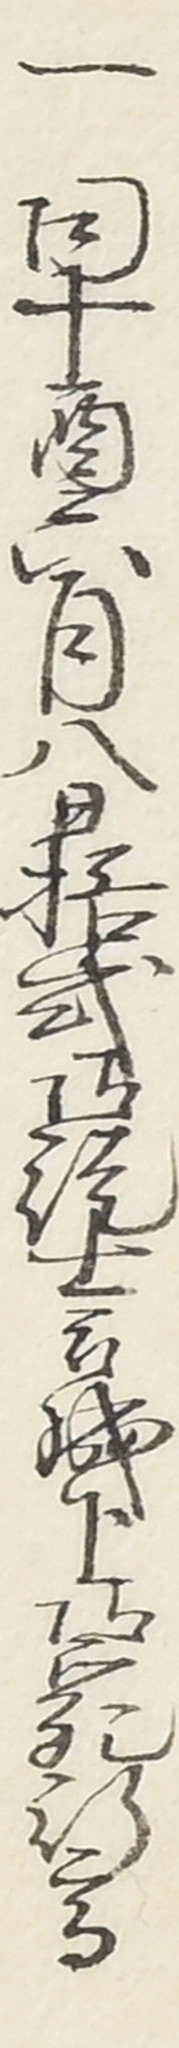一同十酉六月八日格式御徒士被成下御宛行高
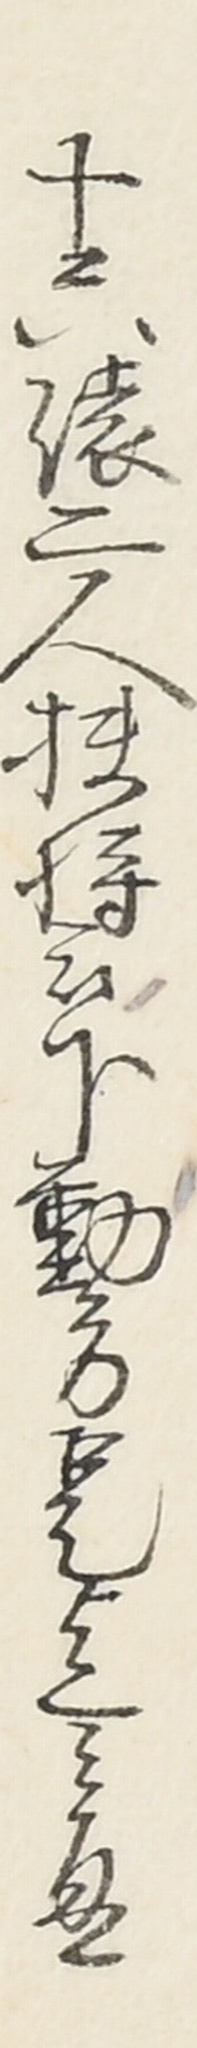十六俵二人扶持被下勤方是迄之通
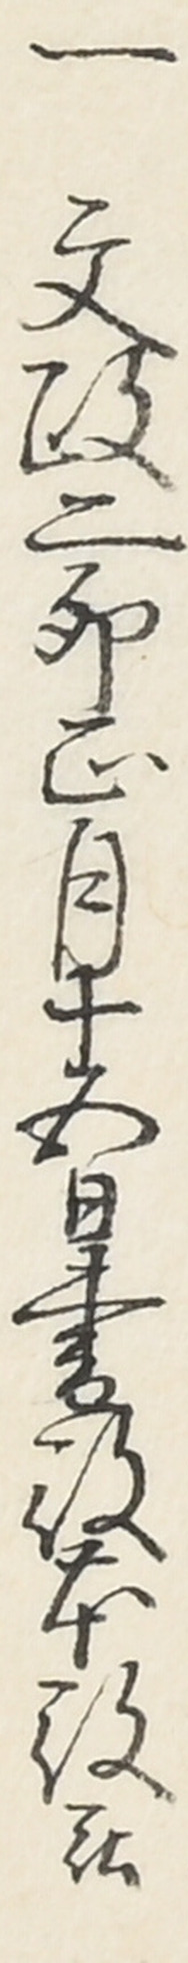一文政二卯正月十五日書役本役被
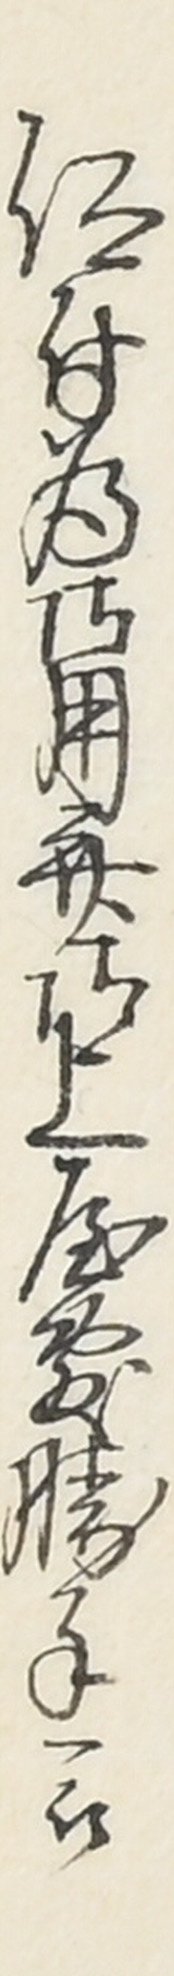仰付為御用弁御上屋敷勝手被
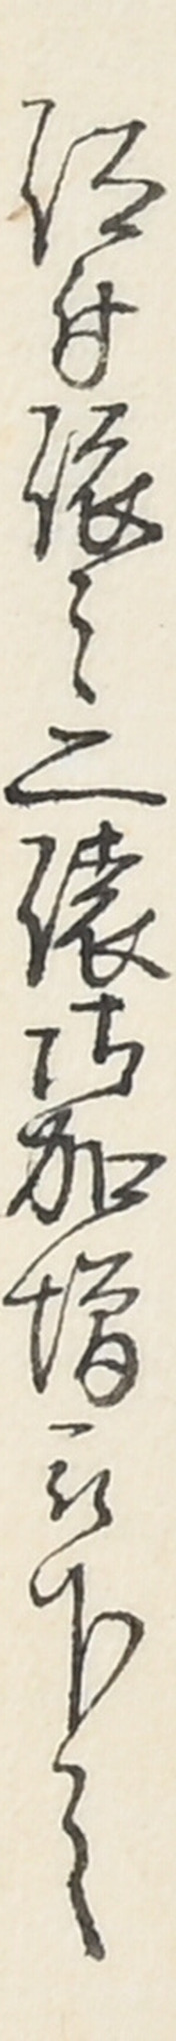仰付依之二俵御加被下之

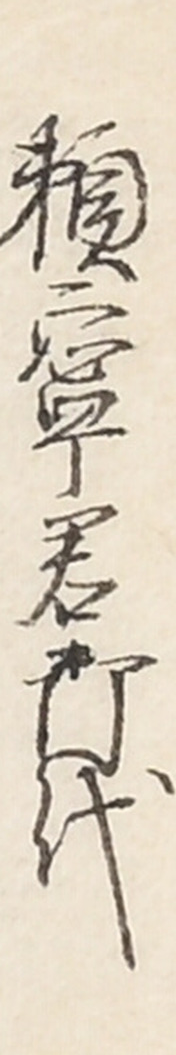頼寧君御代
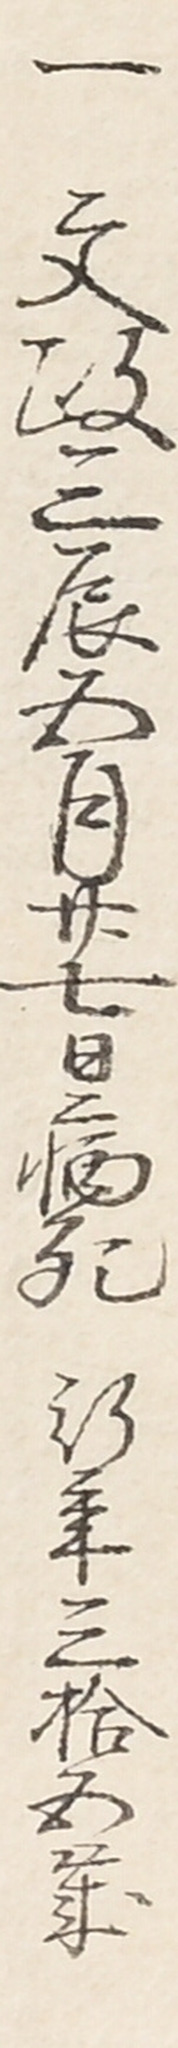一文政三辰五月廿七日病死行年三拾五歳
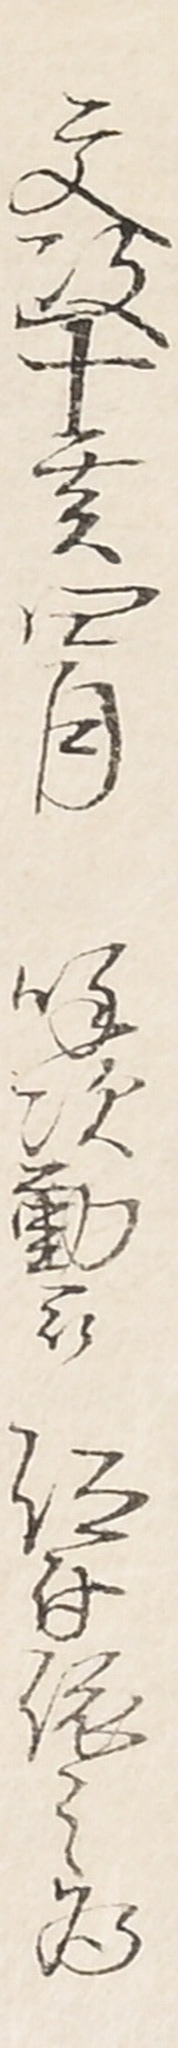一文政十亥四月呼次勤被仰付依之為
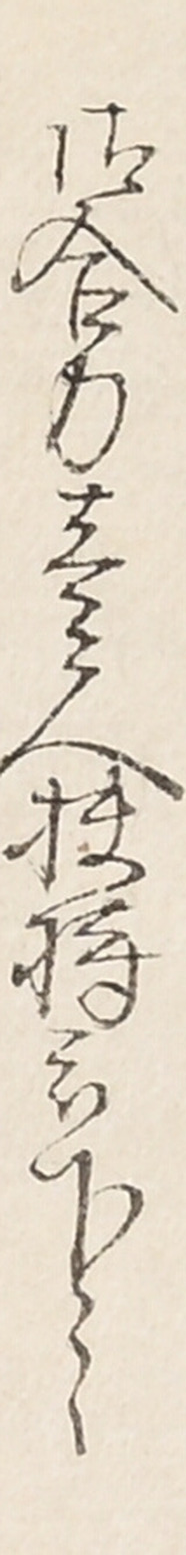御合力壱人扶持被下之
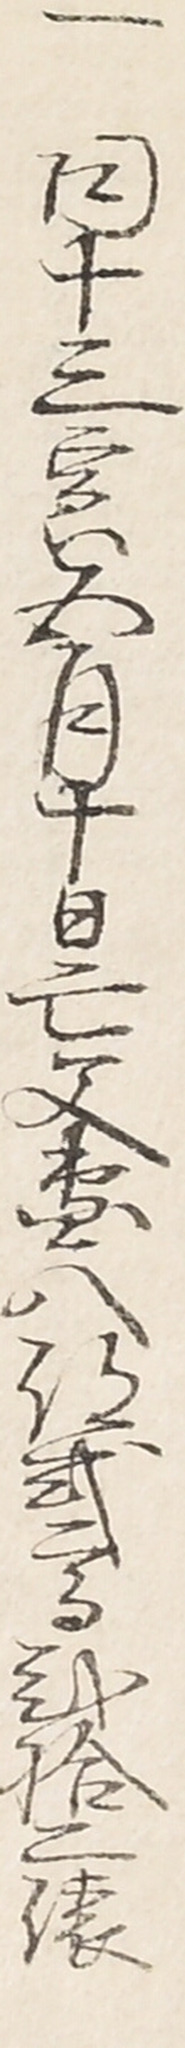一同十三寅五月十日亡父団八跡式高弐拾二俵
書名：無足諸士勤仕録（四）
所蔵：伊那市立高遠町図書館・合同会社AMANE
